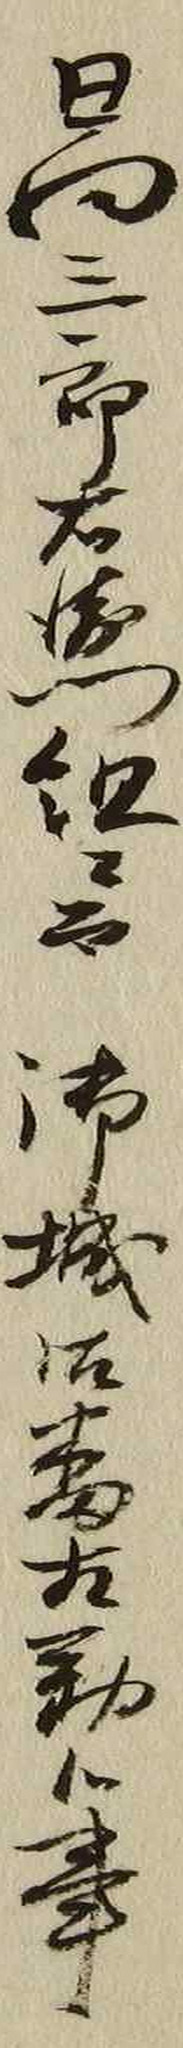日向三郎右衛門組ニ而御城御番相勤候事
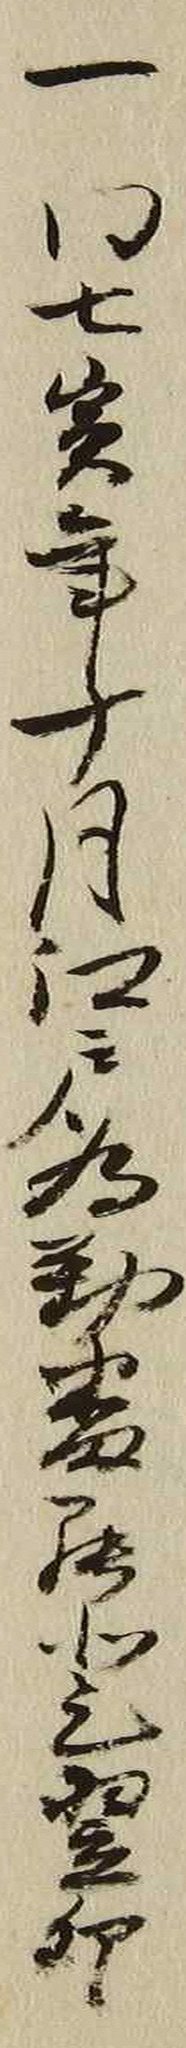一同七寅年十月江戸為勤番罷登翌卯
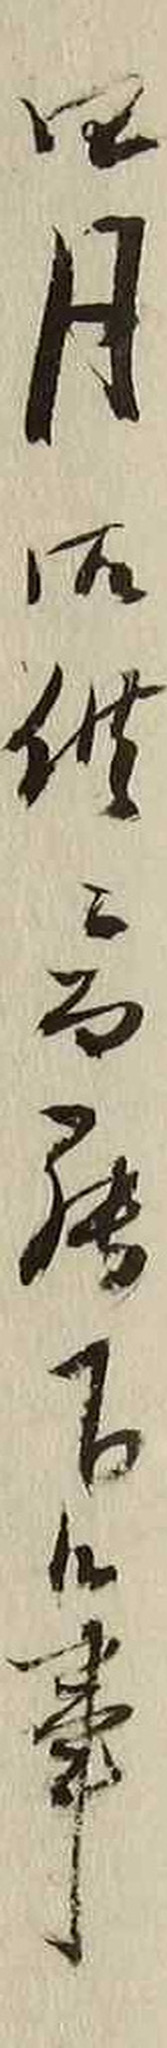四月御供ニ而罷下候事
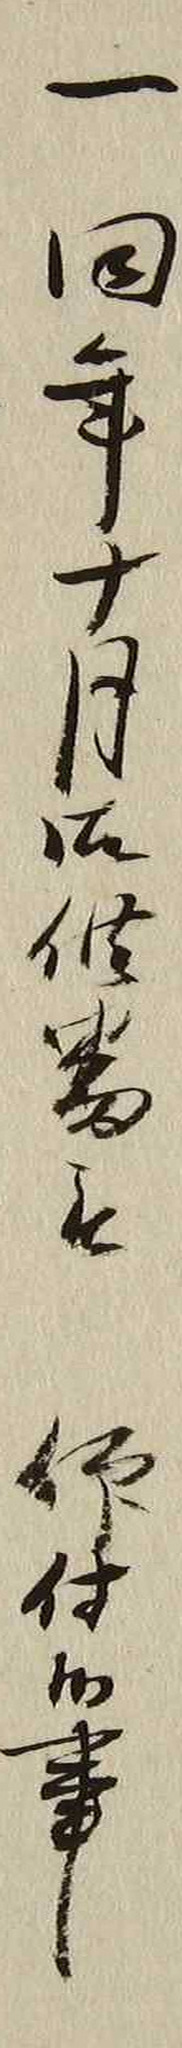一同年十月御供番被仰付候事
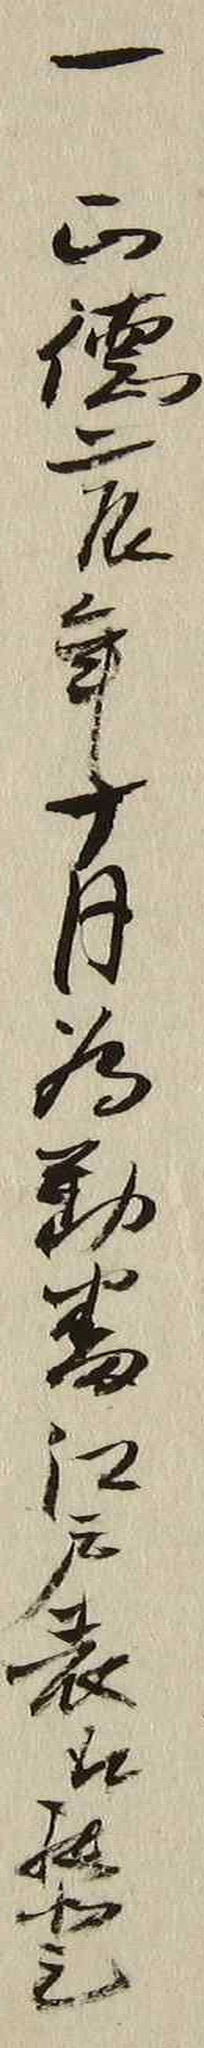一正徳二辰年十月為勤番江戸表江罷登
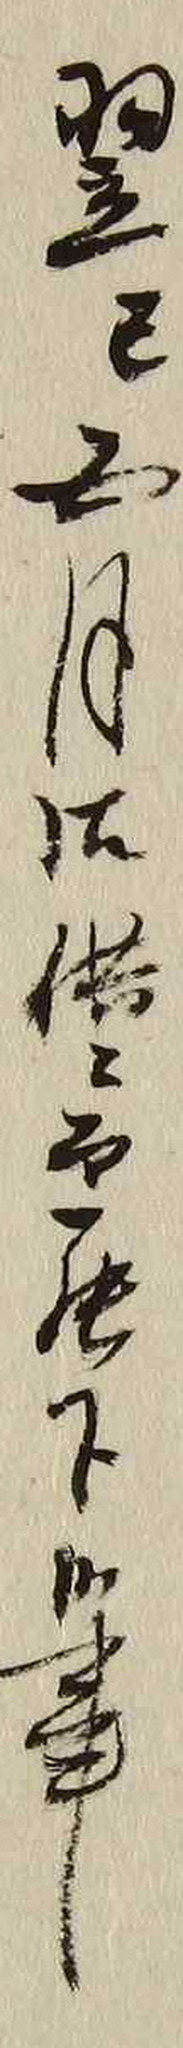翌巳五月御供ニ而罷下候事
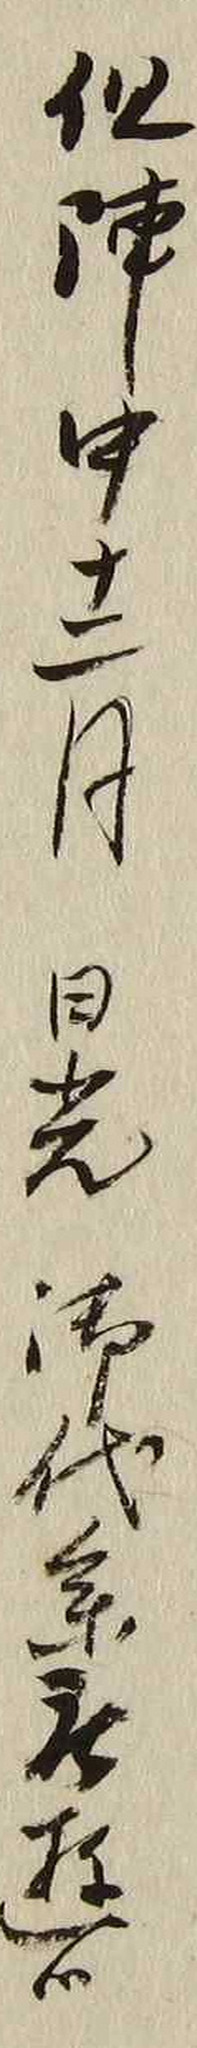但陣中十二月日光御代参被遊候
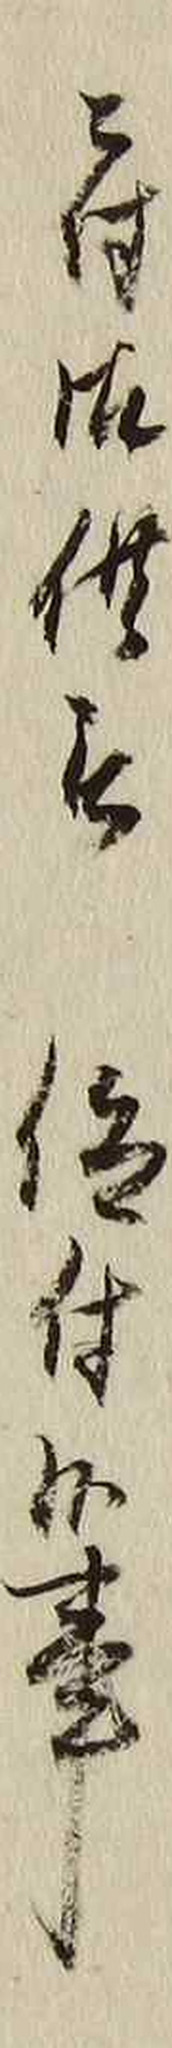ニ付御供被仰付候事
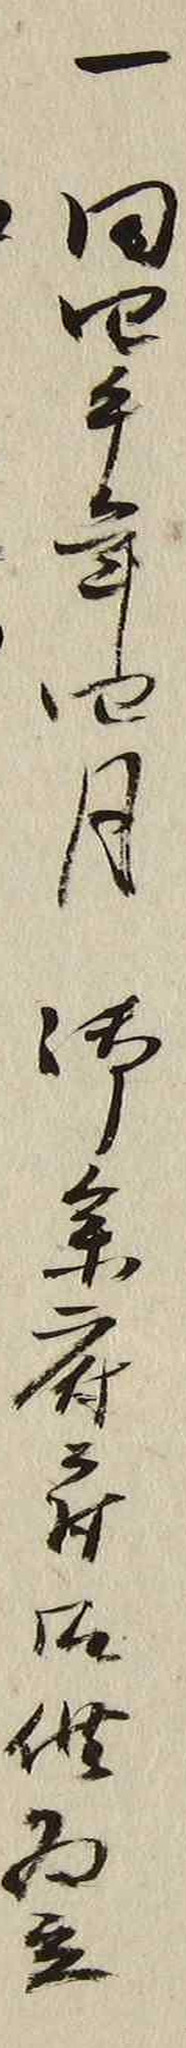一同四午年四月御参府ニ付御供為立
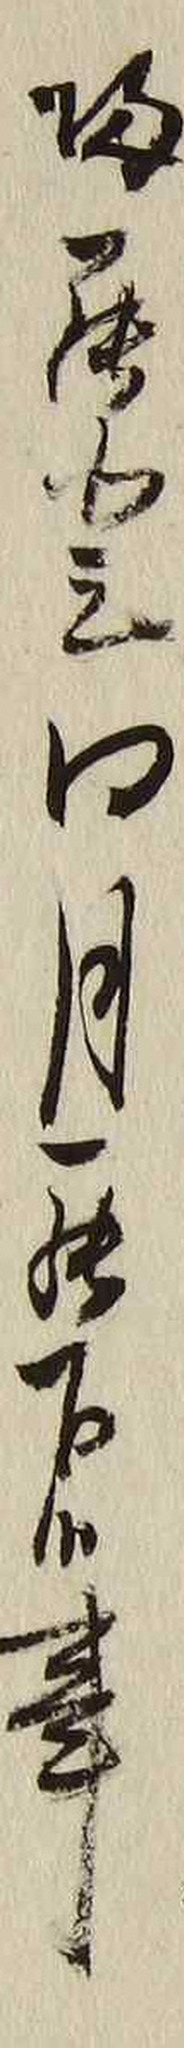帰罷登四月罷下候事
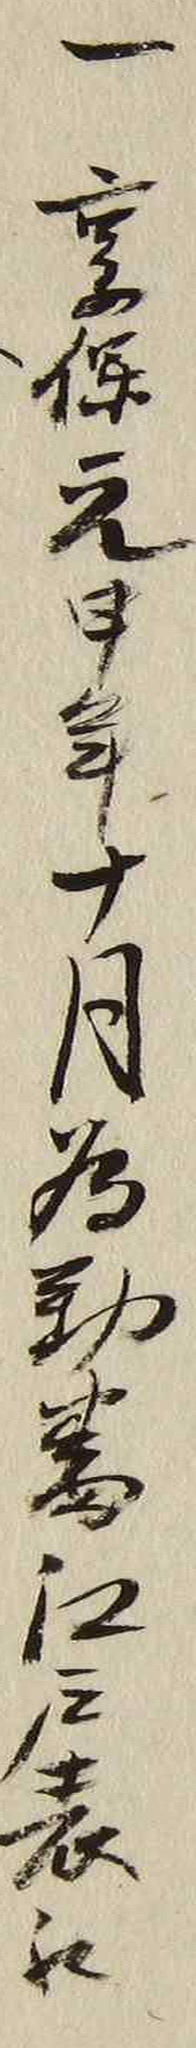一享保元申年十月為勤番江戸表江
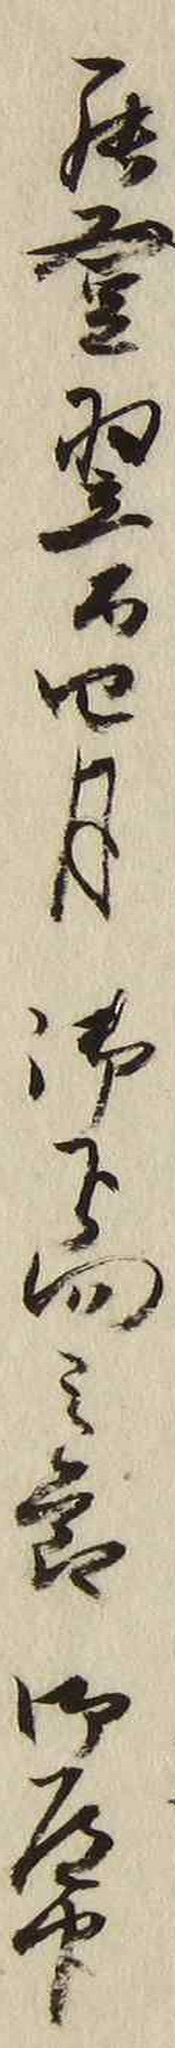罷登翌酉四月御下向之節御道中

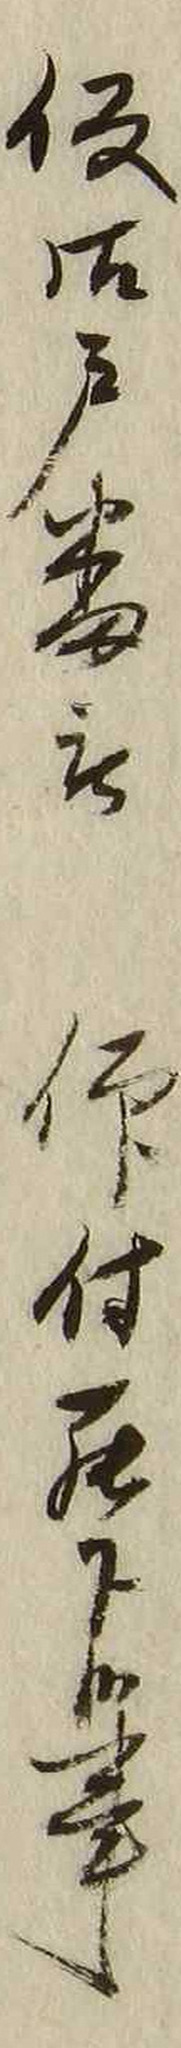仮御戸番被仰付罷下候事
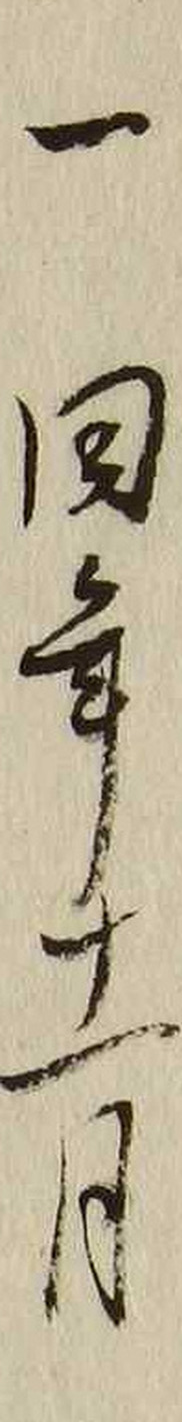一同年十一月
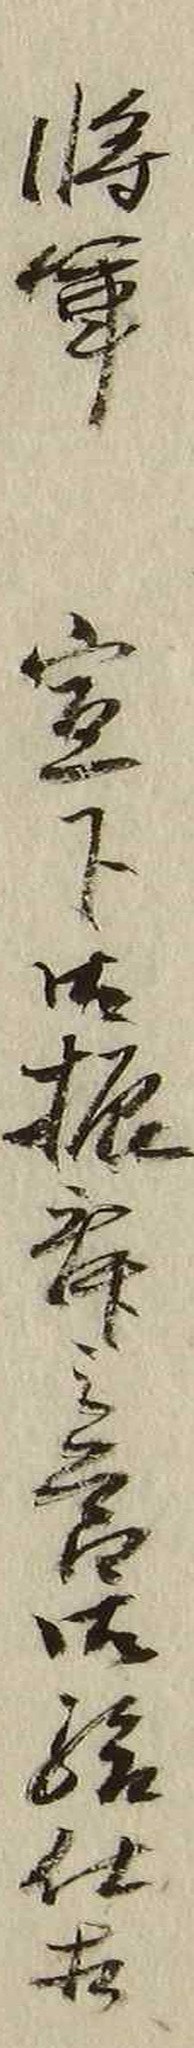将軍宣下御振舞之節御給仕相
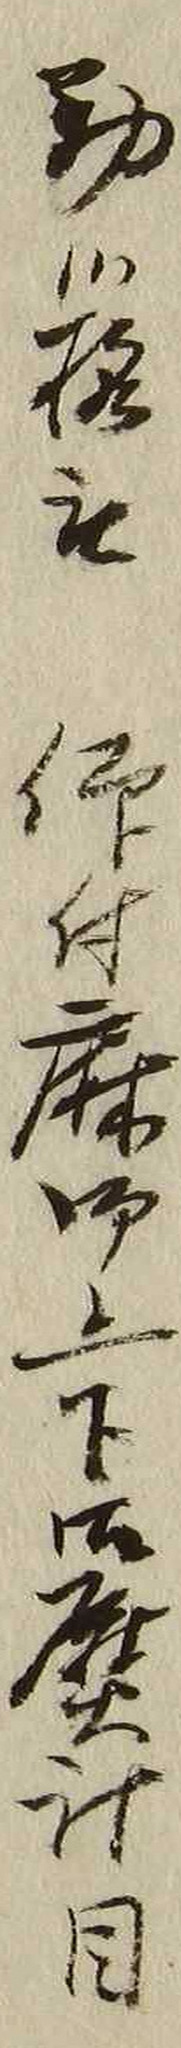勤御様被仰付麻御上下御熨斗目
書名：諸士系譜　巻之345　も之部1
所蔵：会津若松市立会津図書館
